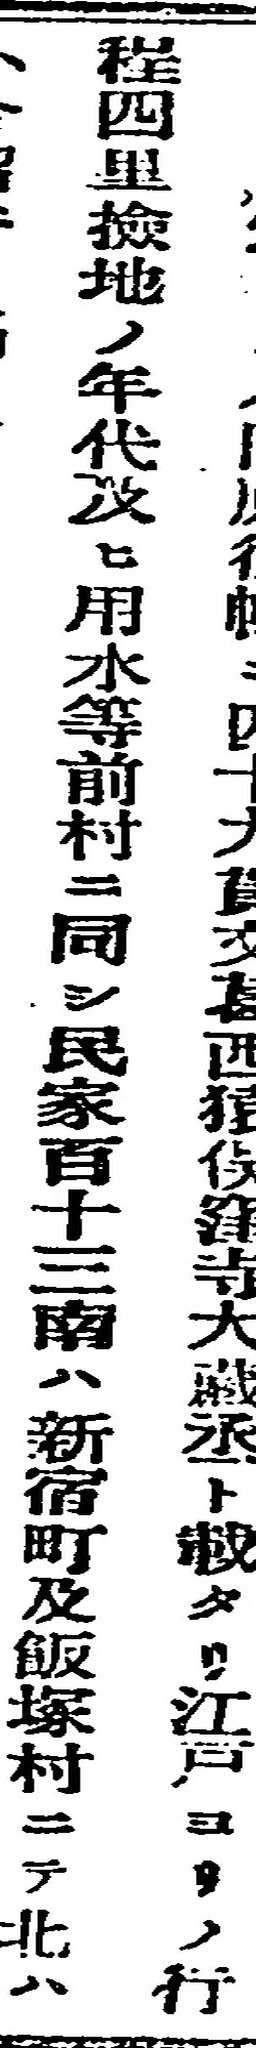程四里検地の年代及ひ用水等前村に同し民家百十三南は新宿町及飯塚村にて北は
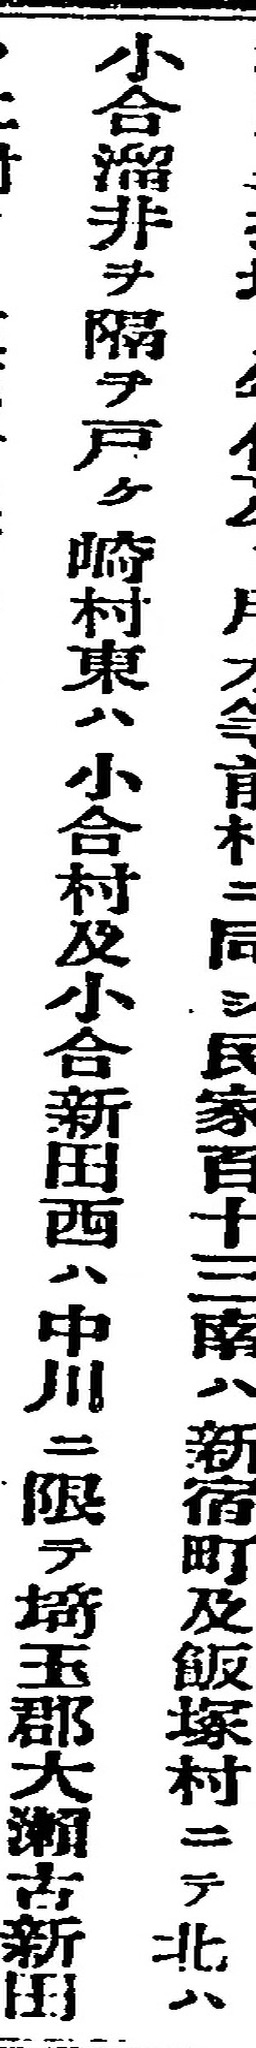小合溜井を隔て戸ヶ崎村東は小合村及小合新田西は中川に限て埼玉郡大瀬子新田
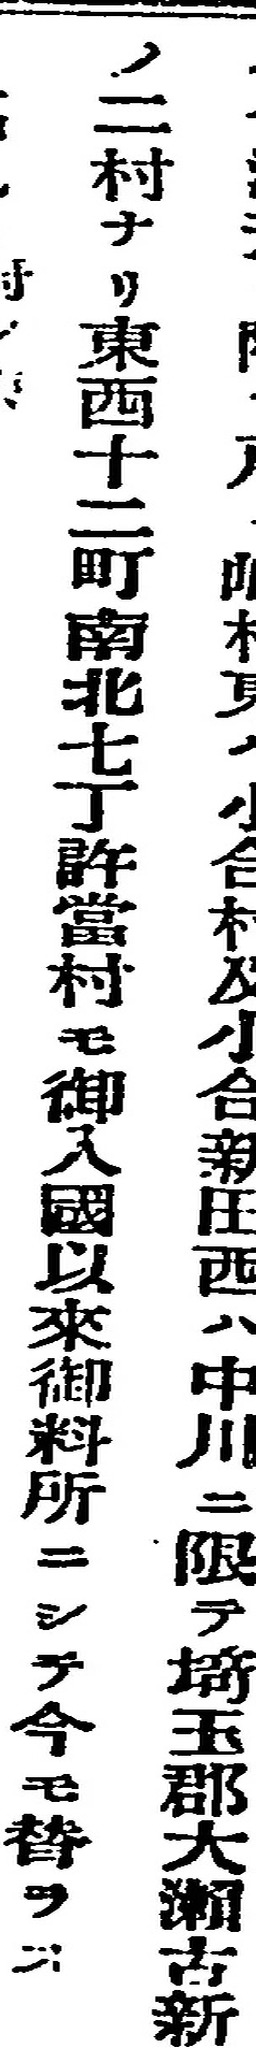の二村なり東西十二町南北七丁許当村も御入国以来御料所にして今も替らす
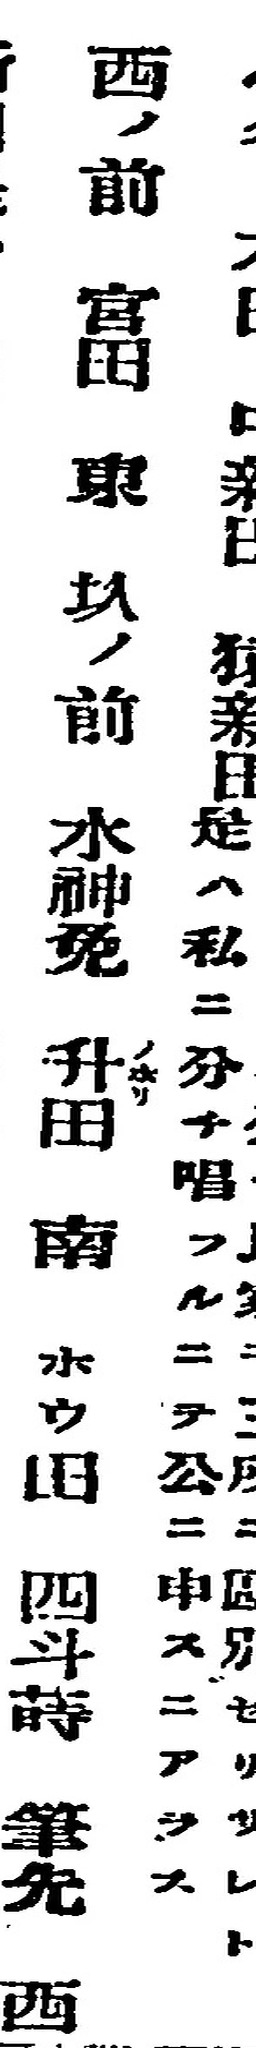西ノ前宮田東圦ノ前水神免升田南ほう田四斗蒔筆先西

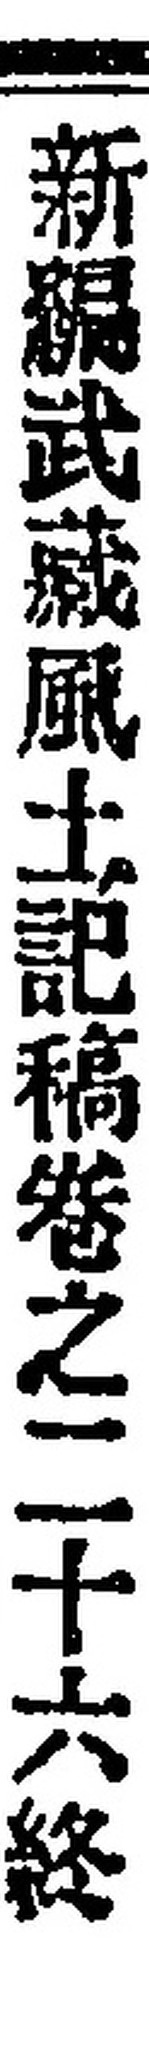新編武蔵風土記稿巻之二十六終
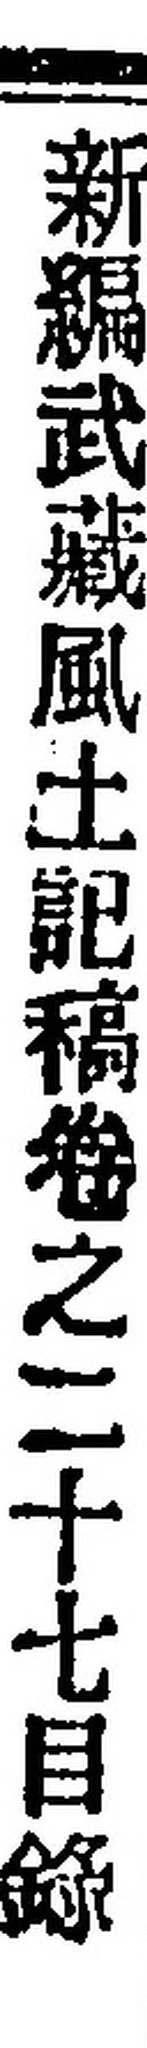新編武蔵風土記稿巻之二十七目録
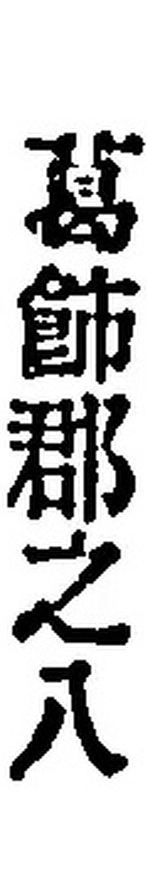葛飾郡之八

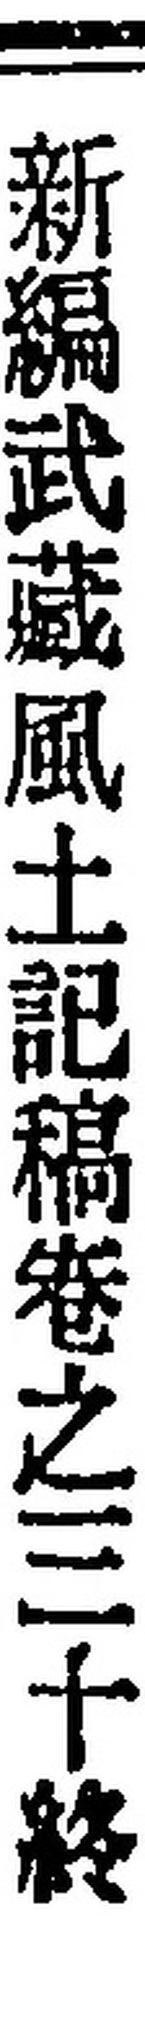新編武蔵風土記稿巻之三十終
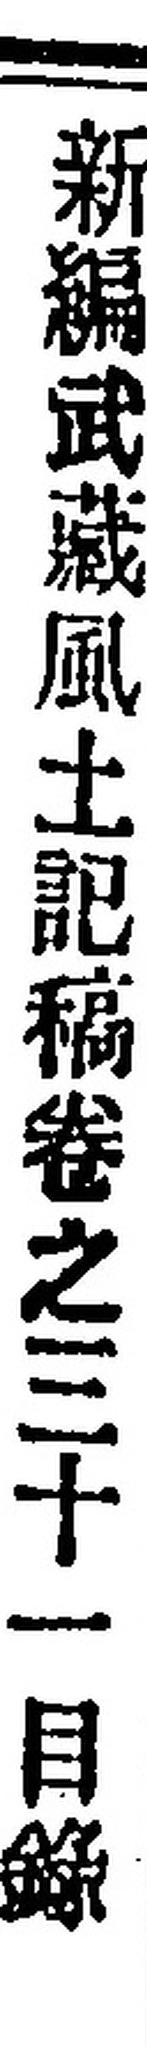新編武蔵風土記稿巻之三十一目録
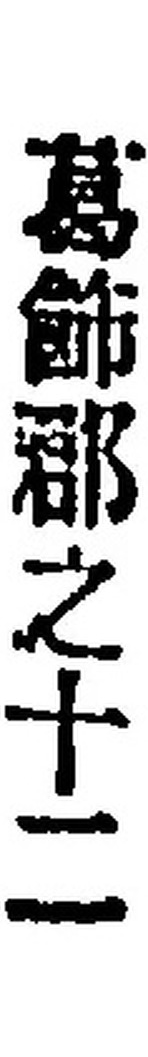葛飾郡之十二
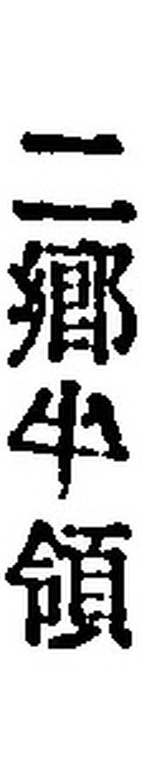二郷半領
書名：新編武蔵風土記稿　葛飾郡之６〜１２
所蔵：国立国会図書館 National Diet Library, JAPAN
